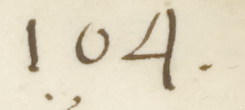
104.
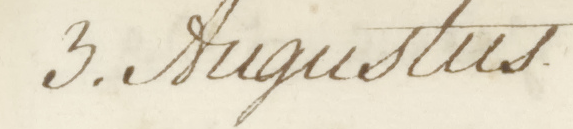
3. Augustus
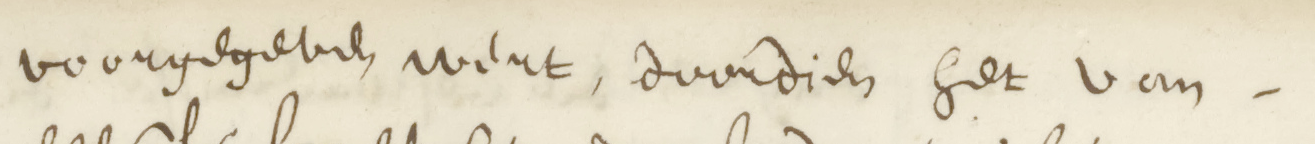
voorgegeven wert, doordien het van -
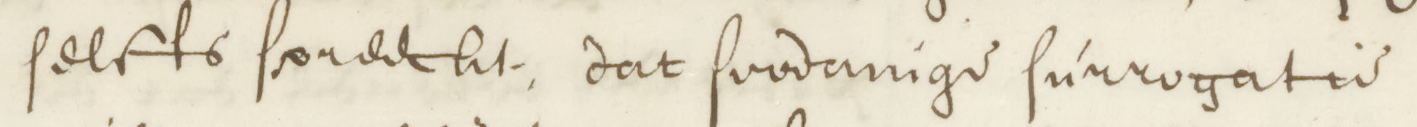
selffs spreeckt, dat soedanige surrogatie
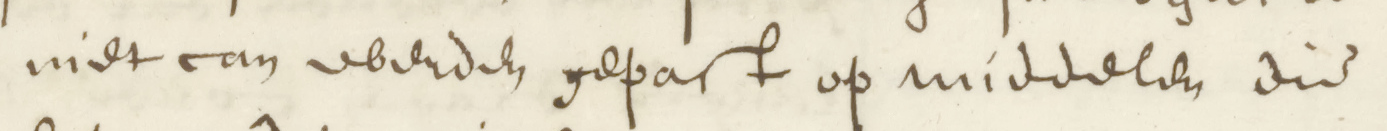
niet can werden gepast op middelen die
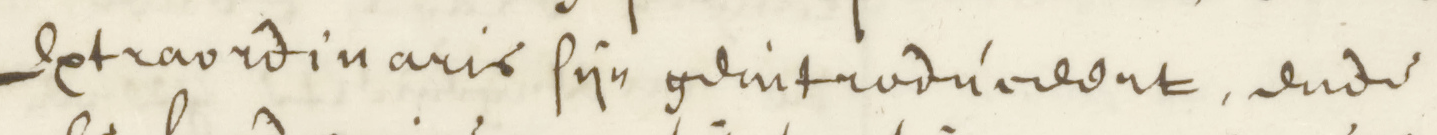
extraordinaris sijn geintroduceert, ende
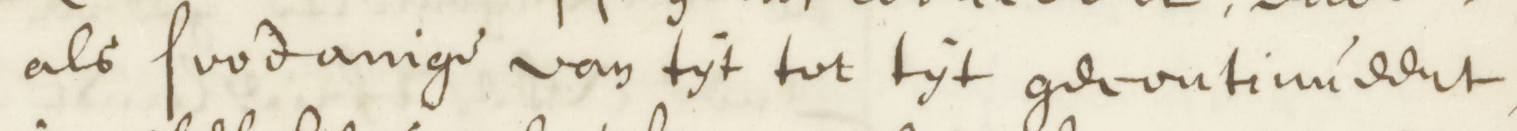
als soodanige van tijt tot tijt gecontinueert
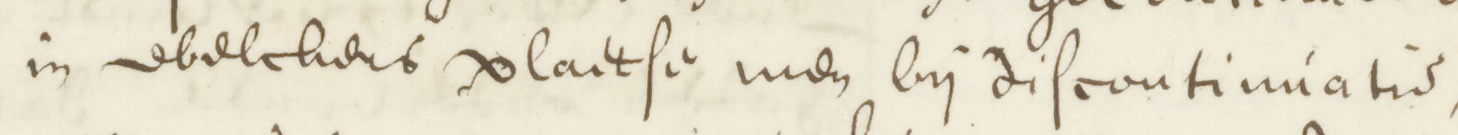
in welckers plaetse men bij discontinuatie
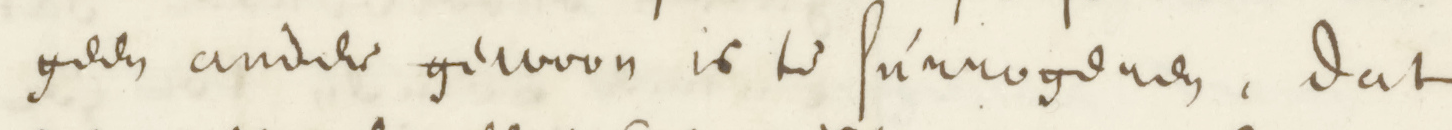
geen ander gewoon is te surrogeren, dat
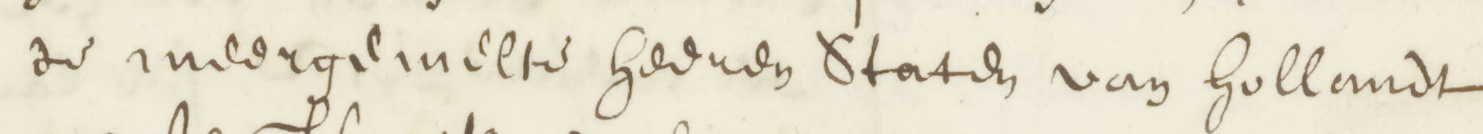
de meergemelte heeren Staten van hollandt
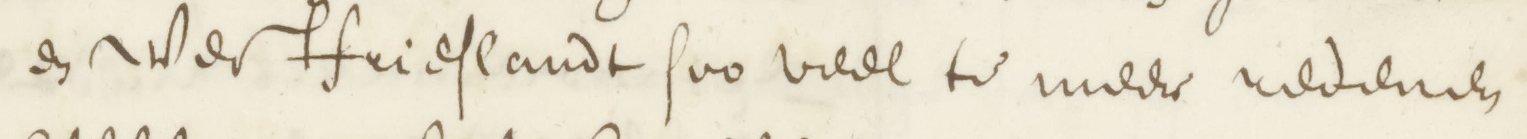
en Westfrieslandt soo veel te meer redenen
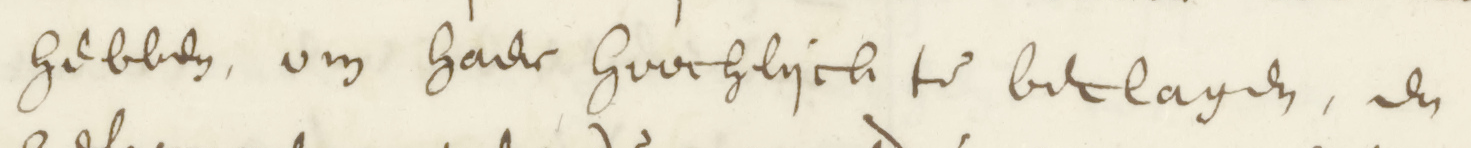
hebben, om haer hoochlijck te beclagen, en
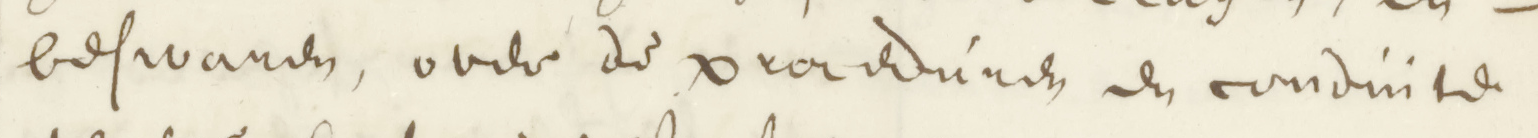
beswaren, over de proceduren en conduite
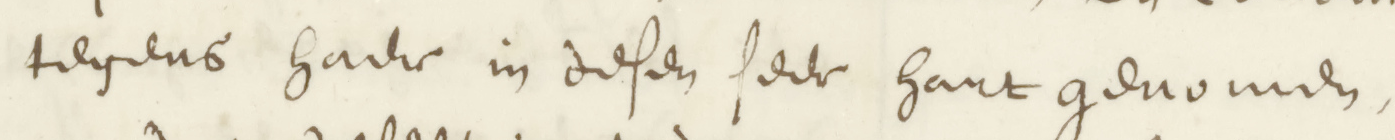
tegens haer in desen seer hart genomen
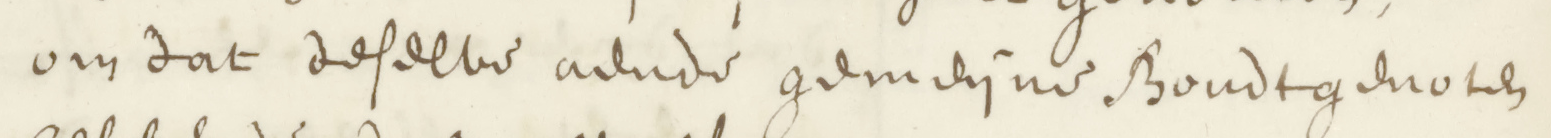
om dat deselve aende gemeijne Bondtgenoten
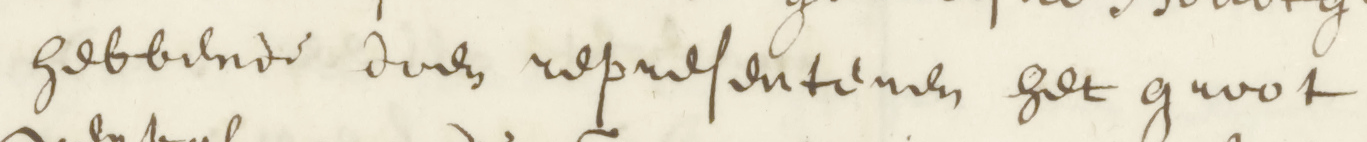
hebbende doen representeren het groot
